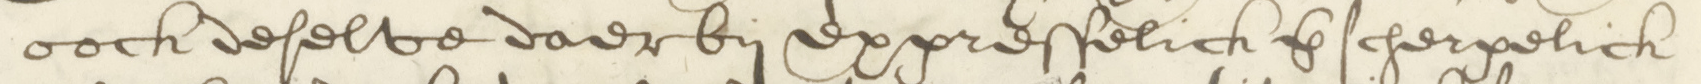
oock deselve daerbij expresselick & scherpelick
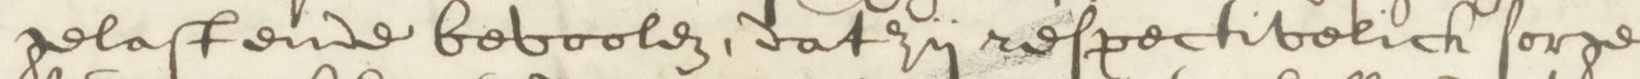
gelast ende bevoolen, dat zij respectivelick sorge
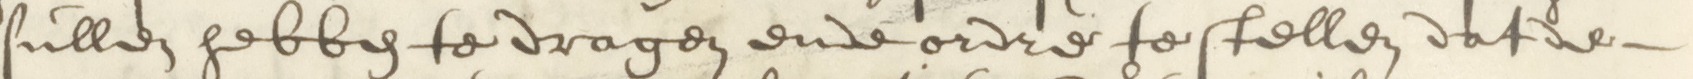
sullen hebben te dragen ende ordre te stellen dat de
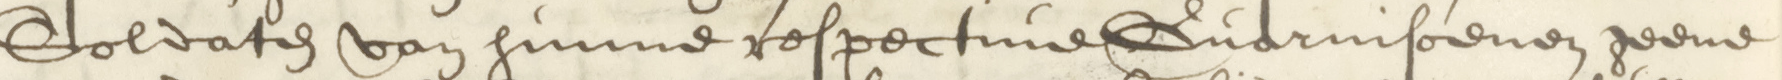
Soldaten van hunne respectiue Guarnisoenen geene
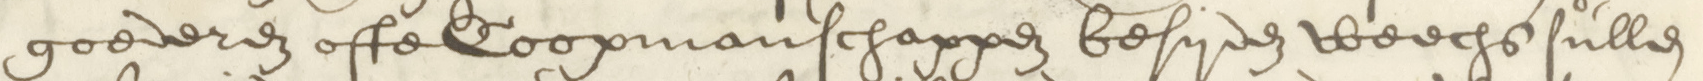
goederen ofte Coopmanschappen besijden weechs sullen
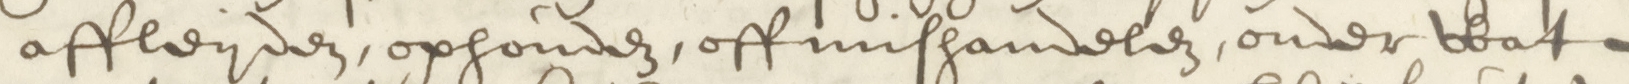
affleijden, ophouden, off mishandelen, onder wat
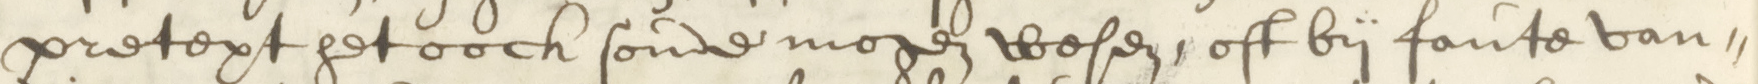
pretext het oock soude mogen wesen, off bij faute van„
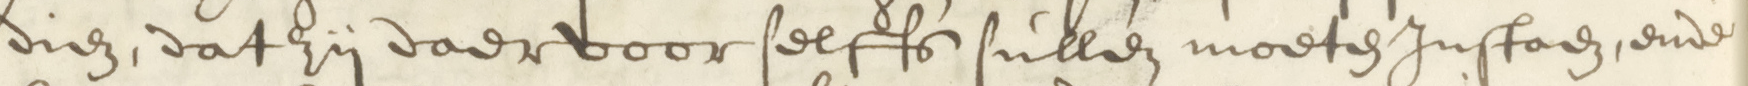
dien, dat zij daervoor selffs sullen moeten Instaen, ende
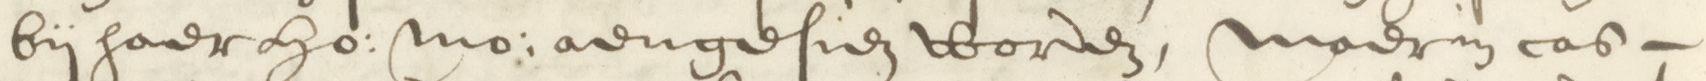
bij haer Ho:Mo: aengesien worden. Maer in cas —
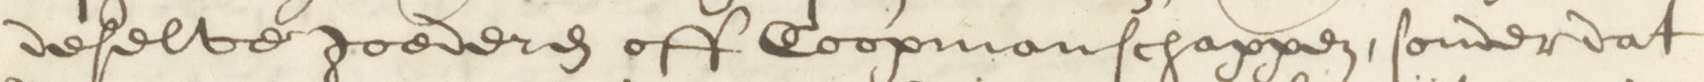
deselve goederen off Coopmanschappen, sonder dat
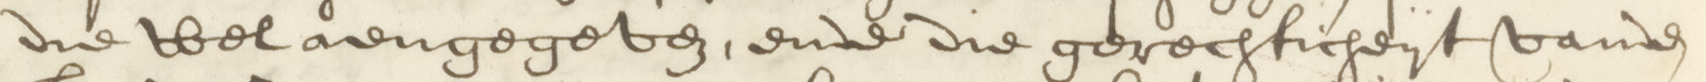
die wel aengegeven, ende die gerechticheijt vanden
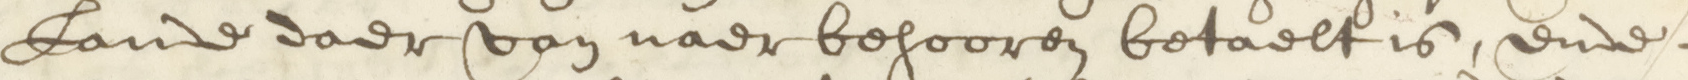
Lande daer van naer behooren betaelt is, ende
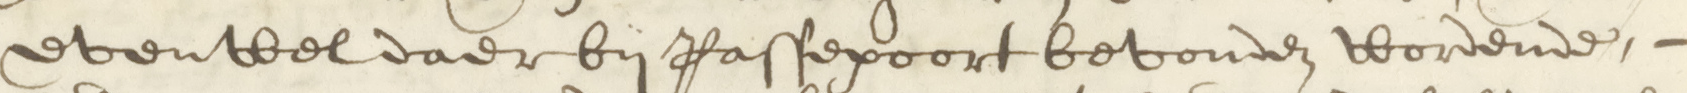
evenwel daerbij passepoort bevonden wordende,
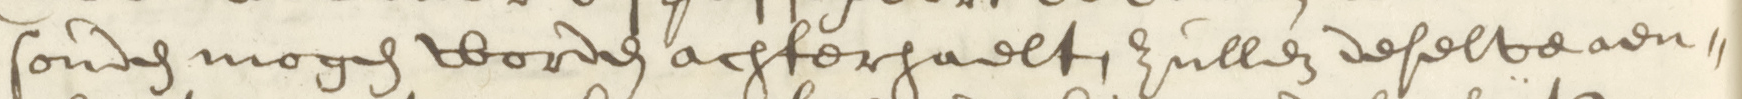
souden mogen worden achterhaelt, zullen deselve aen„
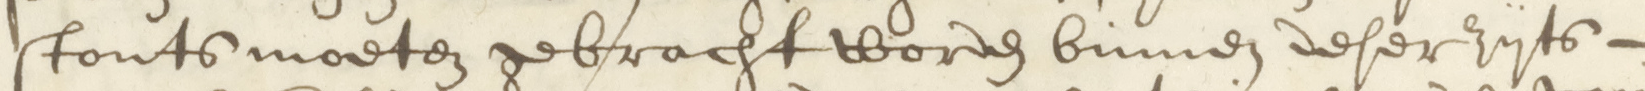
stonts moeten gebracht worden binnen deser zijts
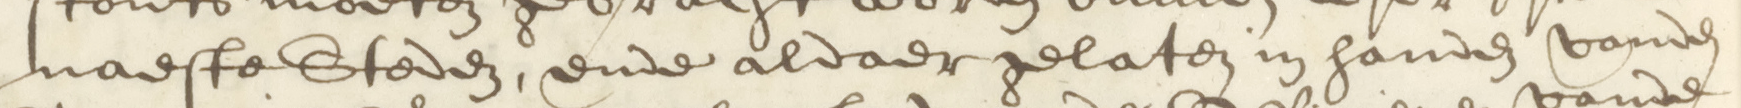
naeste Steden, ende aldaer gelaten in handen vanden
